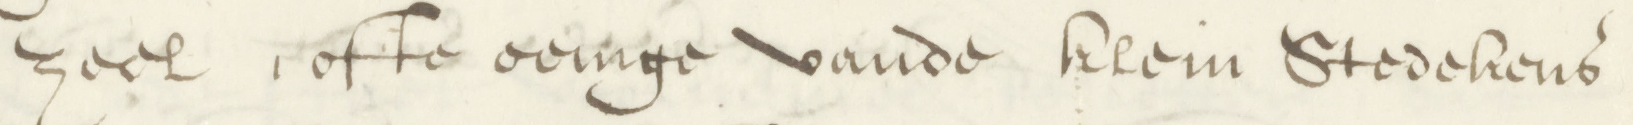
zeel ,ofte eenige vande klein Stedekens
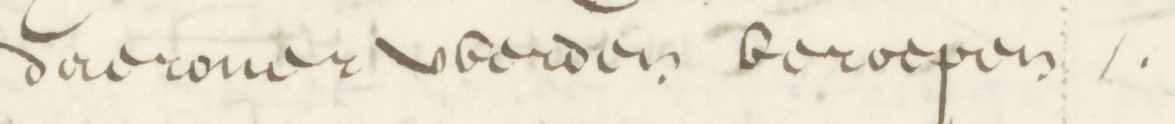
daerouer werden beroepen.
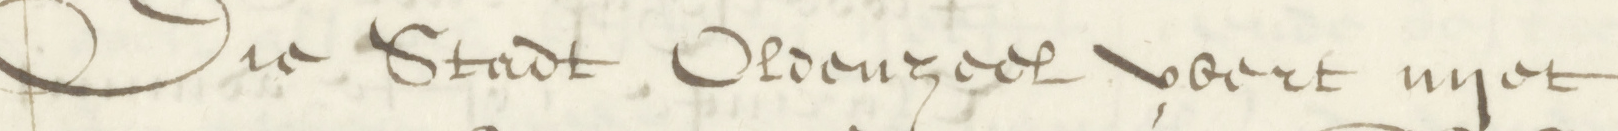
Die Stadt, Oldenzeel wert nyet
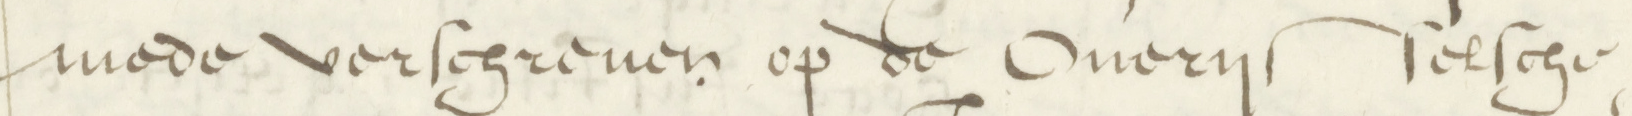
mede verschreuen op de Ouerysselsche
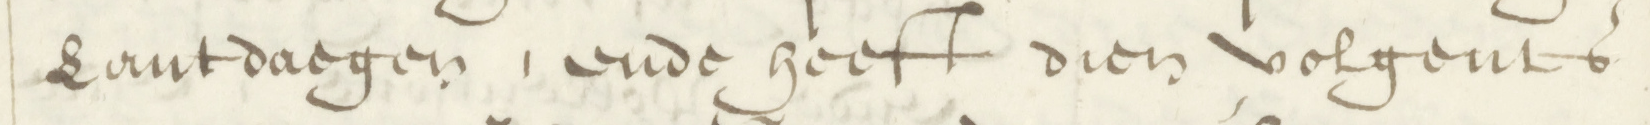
Lantdaegen, ende heeft dien volgents
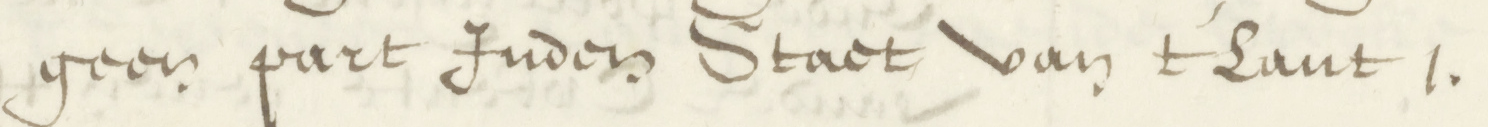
geen part Inden Staet van t'Lant.
